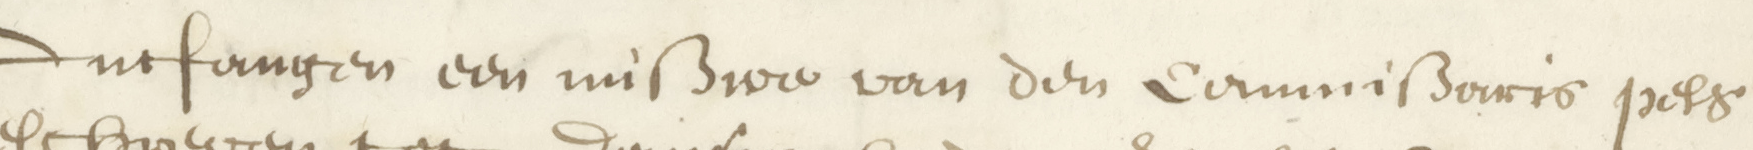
Ontfangen een missive van den Commissaris pels
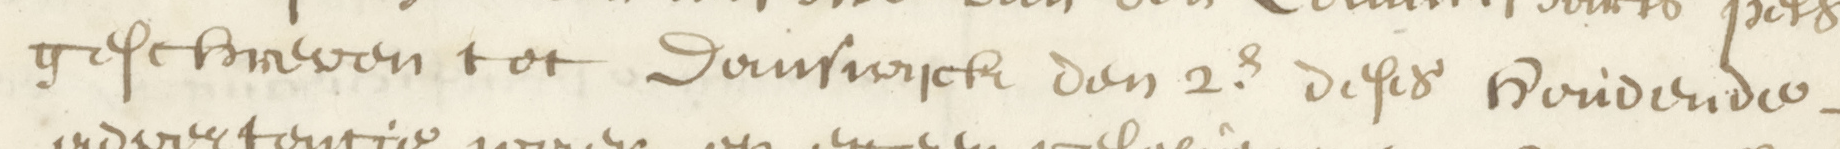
geschreven tot Danswyck den 2en. deses houdende
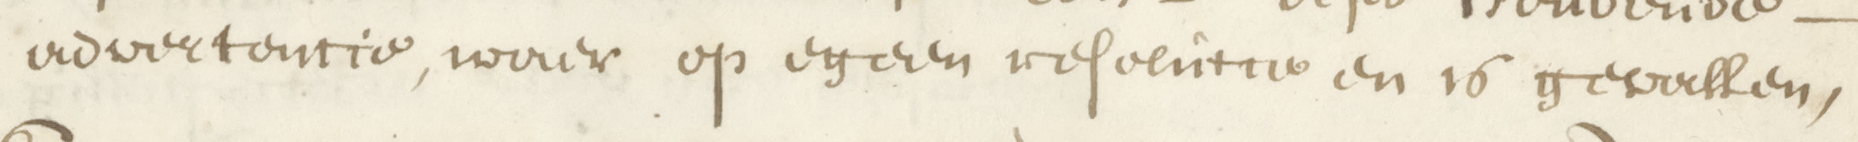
advertentie, waer op egeen resolutie en is gevallen.
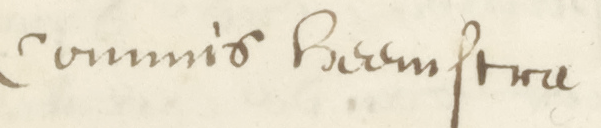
Commis heemstra
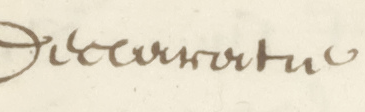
Declaratie
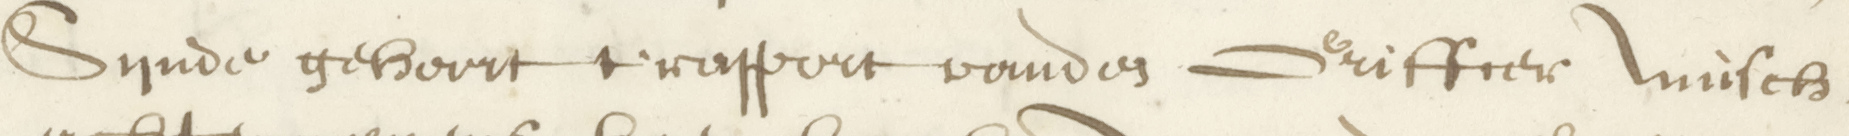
Synde gehoort t' rapport vanden Griffier Musch
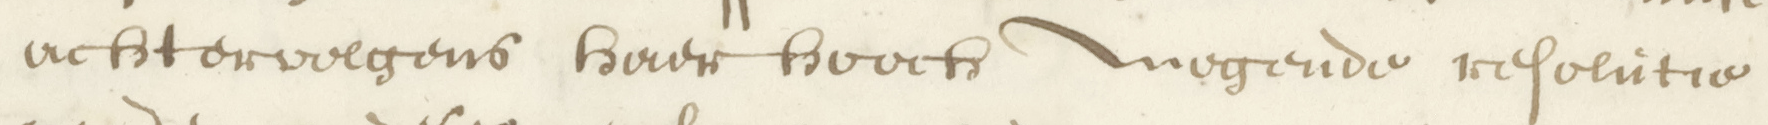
achtervolgens Haer Hooch Mogende resolutie
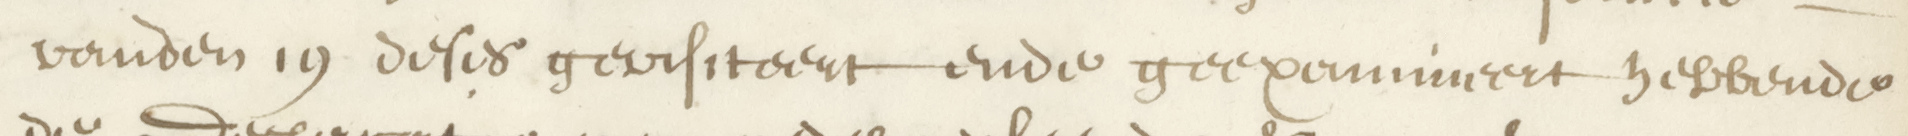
vanden 19 deses gevisiteert ende geexamineert hebbende
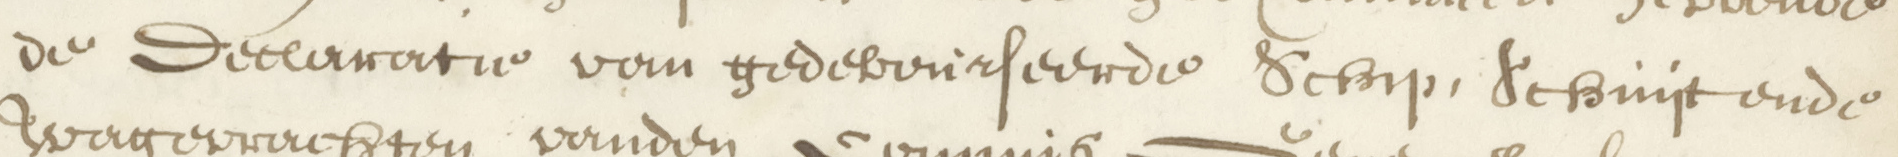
de Declaratie van gedebourseerde Schip, Schuijt ende
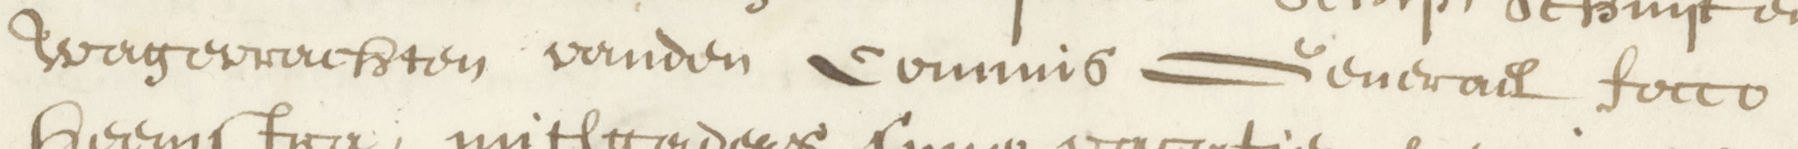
wagevrachten vanden Commis Generael focco
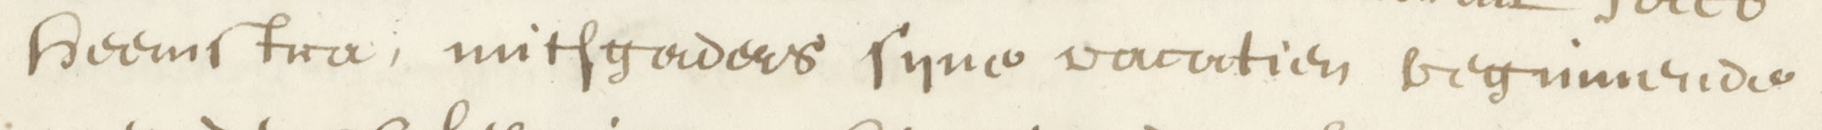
Heemstra, mitsgaders syne vacatien beginnende
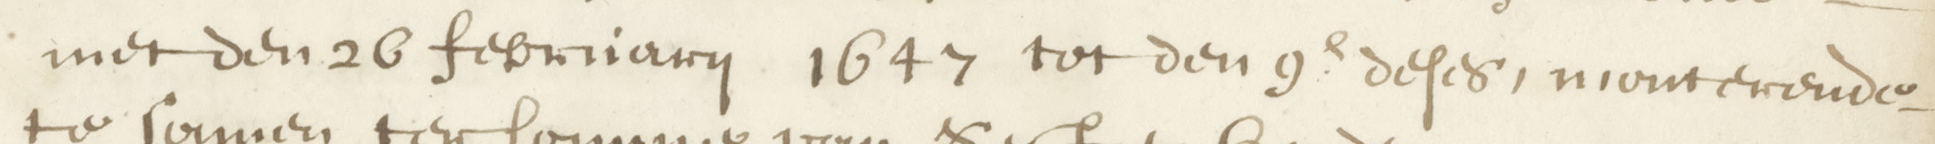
met den 26 february 1647 tot den 9e. deses, monterende
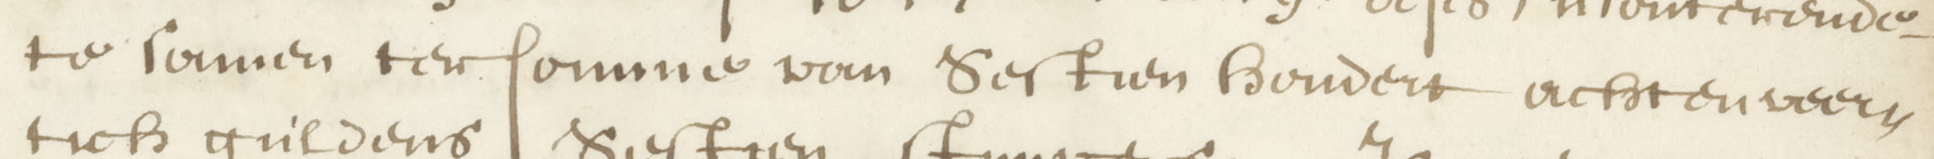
te samen ter somme van Sestien hondert achtenveer„
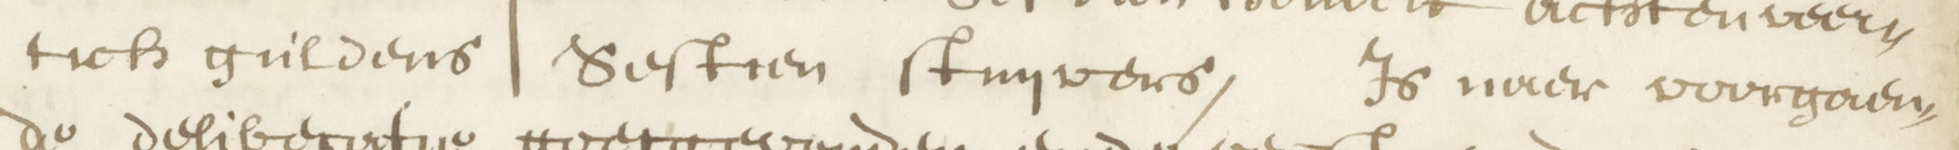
tich guldens Sestien stuyvers. Is naer voorgaen„
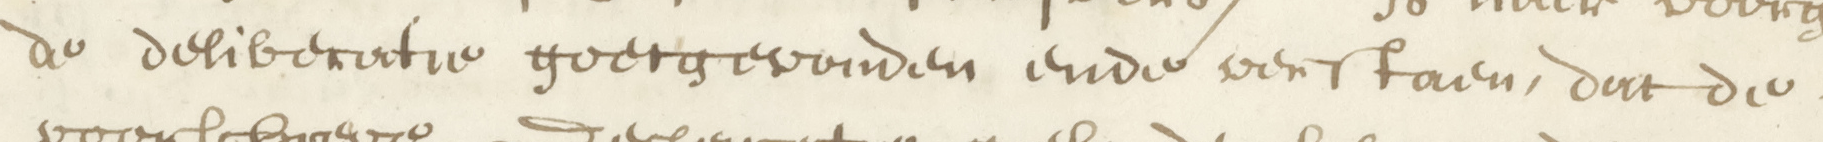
de deliberatie goetgevonden ende verstaen, dat de
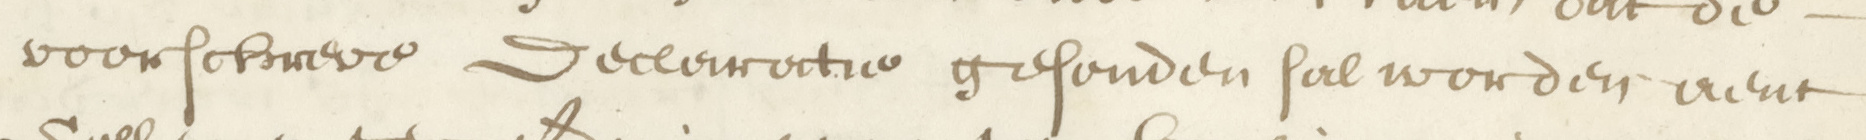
voorschreve Declaratie gesonden sal worden aent
